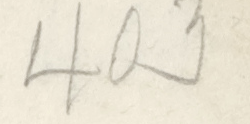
403
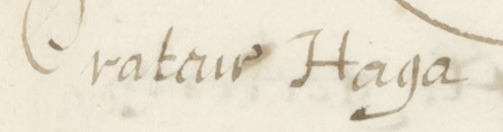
Orateur Haga
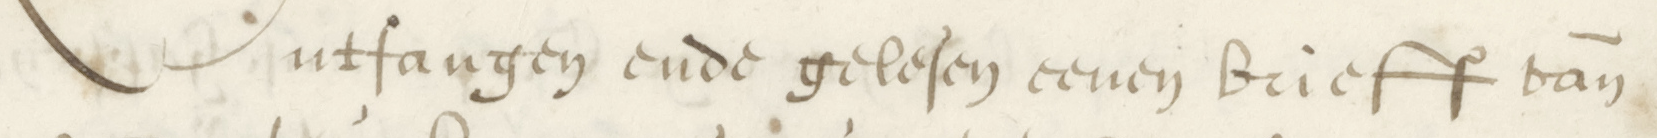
Ontfangen ende gelesen eenen brieff van
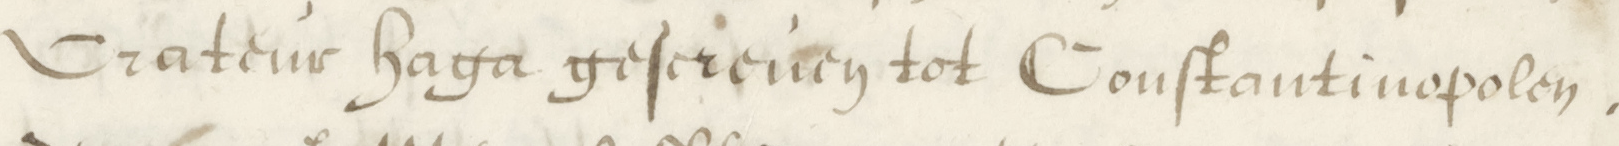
Orateur Haga gescreuen tot Constantinopolen,
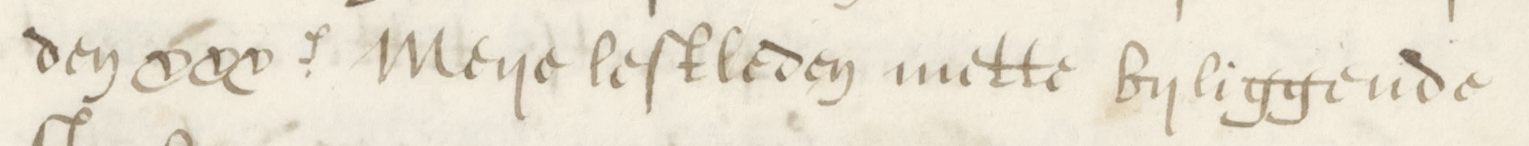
den xxxen. Meye lestleden mette byliggende
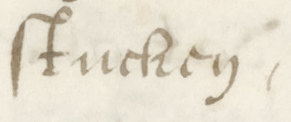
stucken,
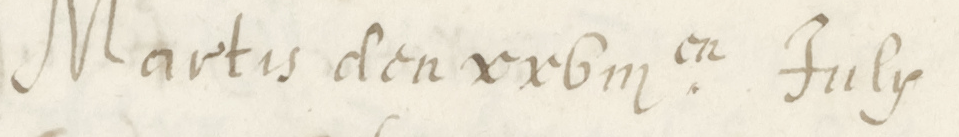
Martis den xxviijen. July
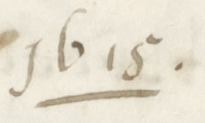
1615.
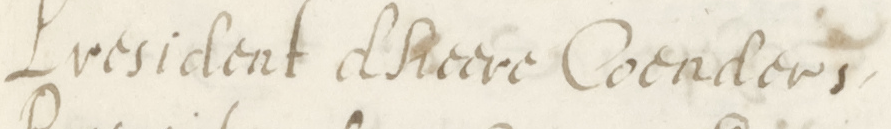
President d'heere Coenders,
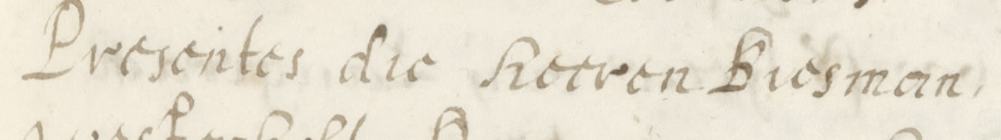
Presentes die heeren Biesman,
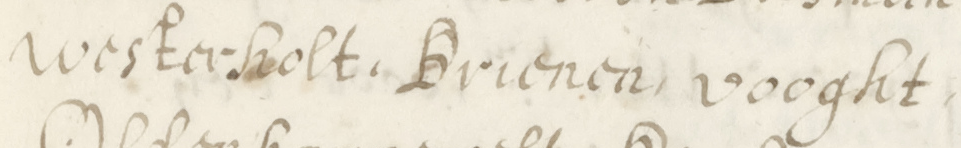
Westerholt, Brienen, vooght.
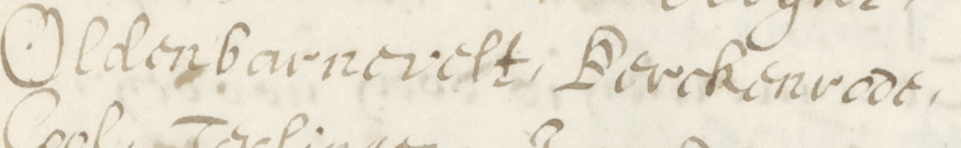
Oldenbarnevelt, Berckenrode,
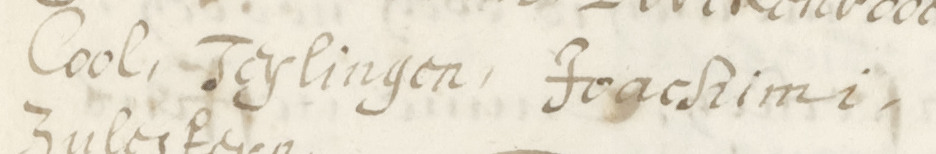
Cool, Teylingen, Joachimi,
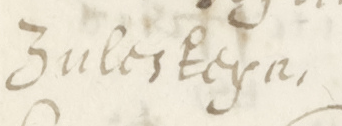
Zulesteyn,
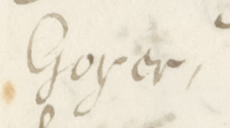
Goyer,
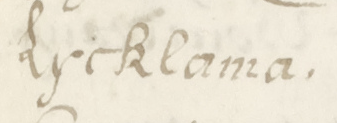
Lycklama,
